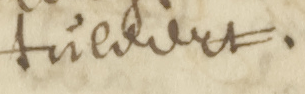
tuleert.
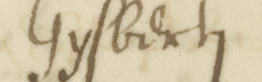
Gysberti
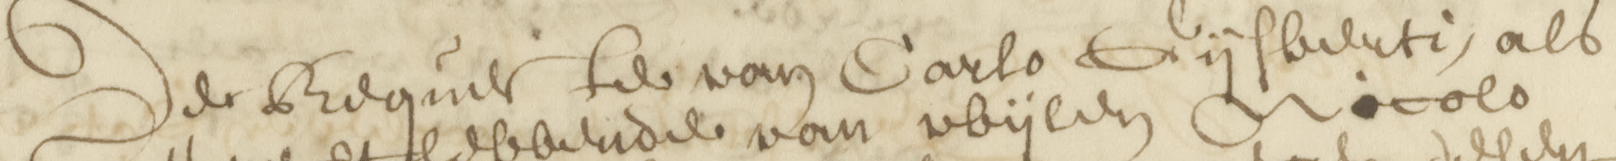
De Requeste van Carlo Gijsberti, als
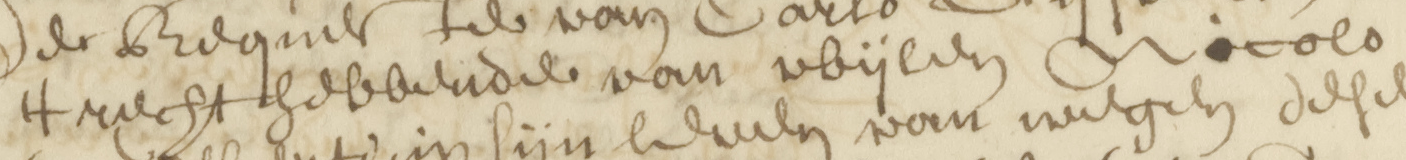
't recht hebbende van wijlen Nicolo
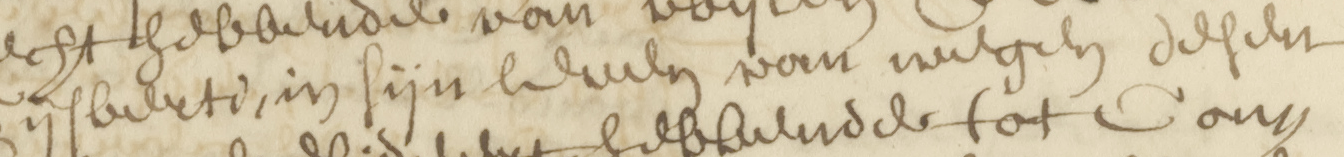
Gijsberti, in sijn leven van wegen desen
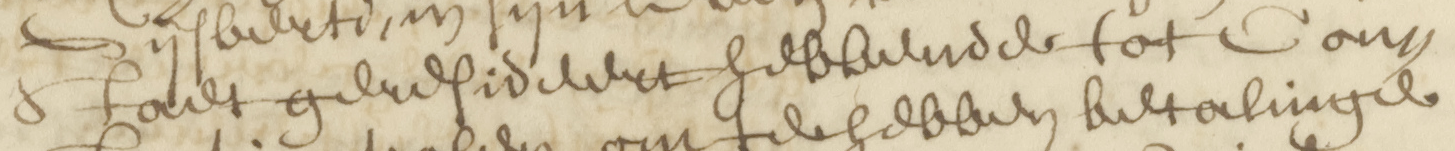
Staet geresideert hebbende tot Con„
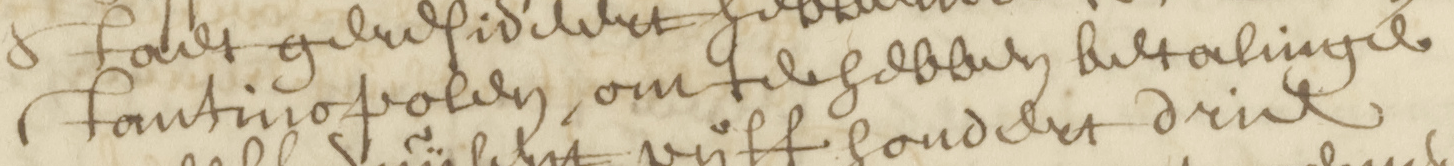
stantinopolen, om te hebben betalinge
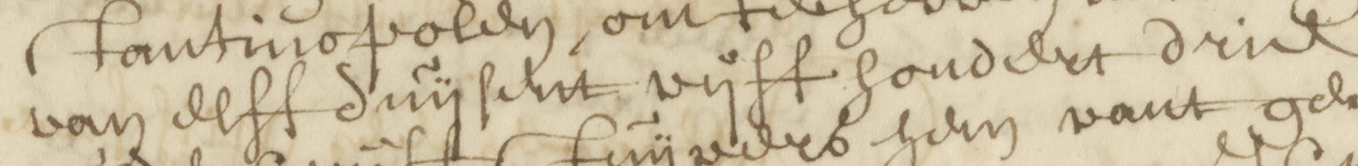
van elffduijsent vijff hondert drie
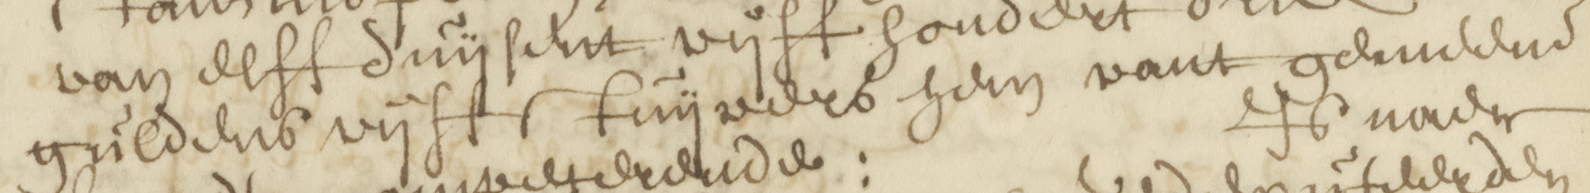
guldens vijff stuijvers hem vant gemeene
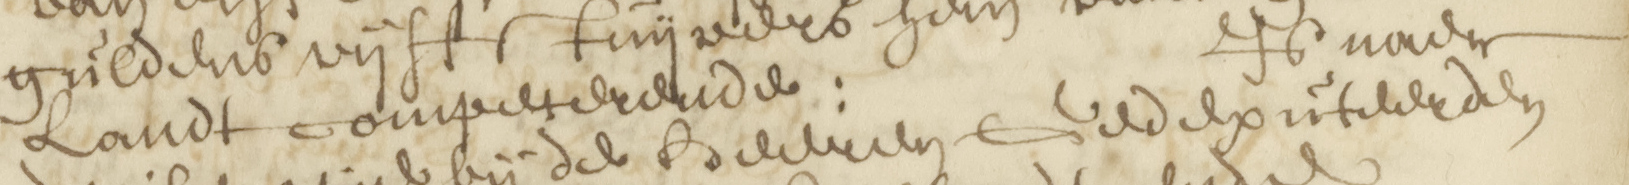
Landt competerende: Is naer
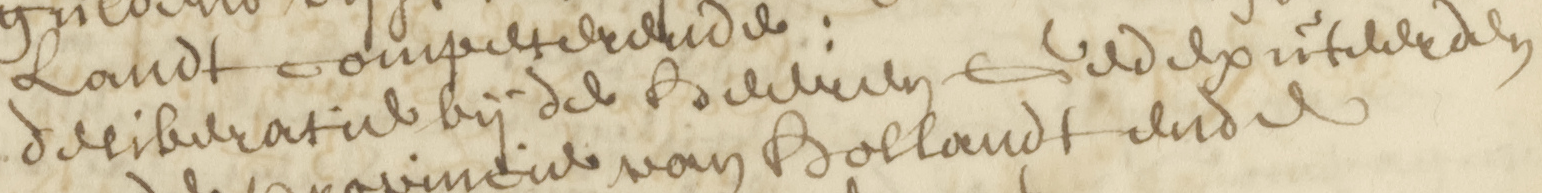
deliberatie bij de Heeren Gedeputeerden
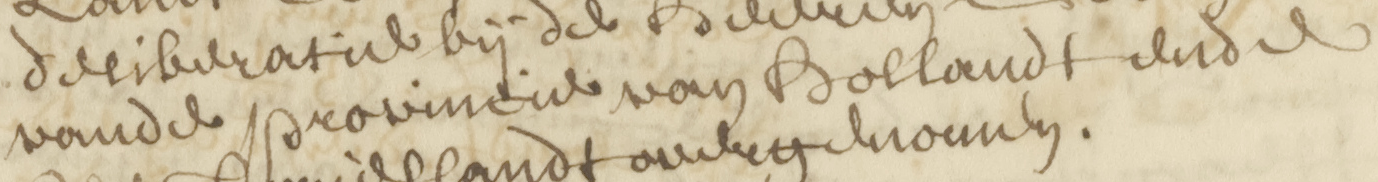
vande provincie van Hollandt ende
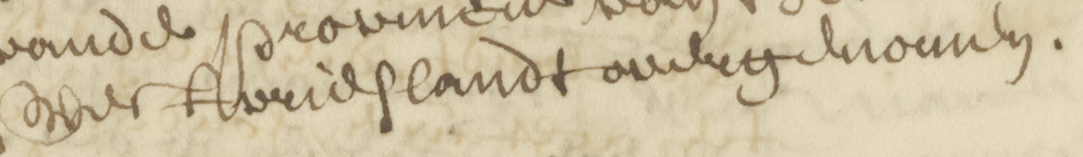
Westvrieslandt overgenomen.
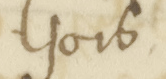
Gois
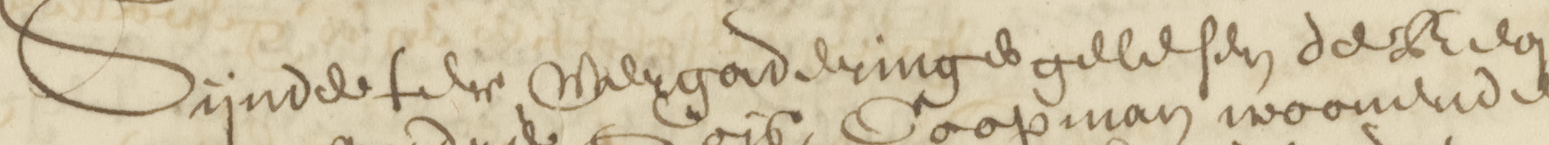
Sijnde ter Vergaderinge gelesen de Reqte.
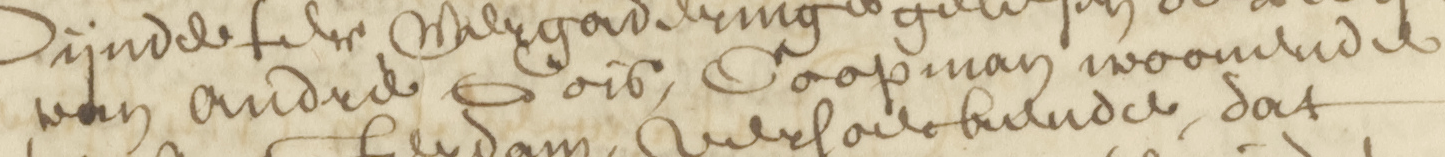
van Andrè Gois, Coopman woonende
